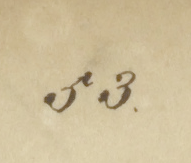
53.
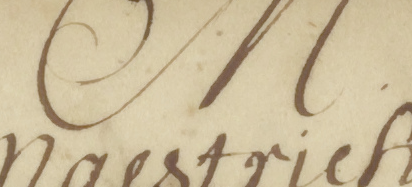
M.
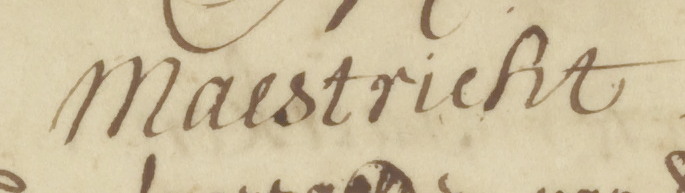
Maestricht.
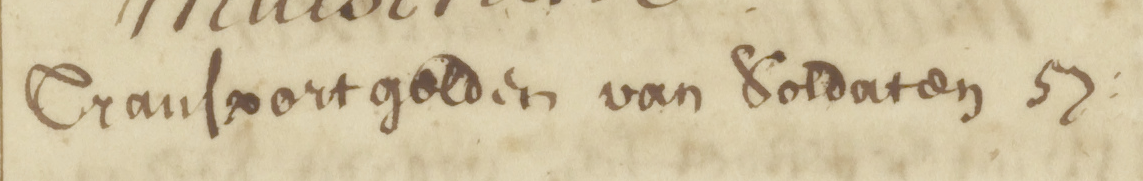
Transportgelden van Soldaten 57:
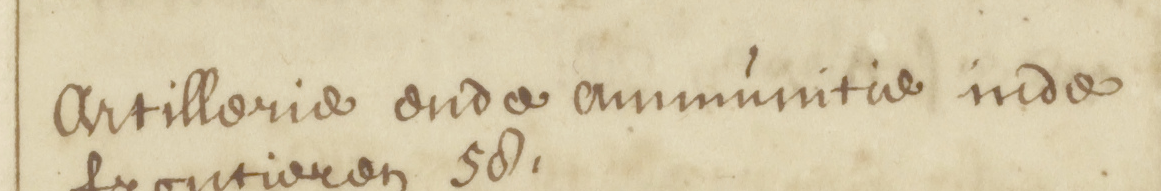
Artillerie ende ammunitie inde
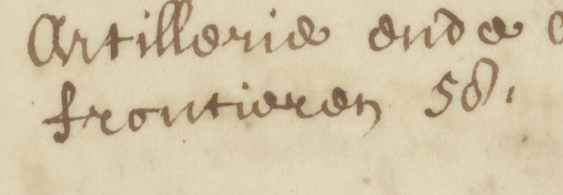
frontieren 58.
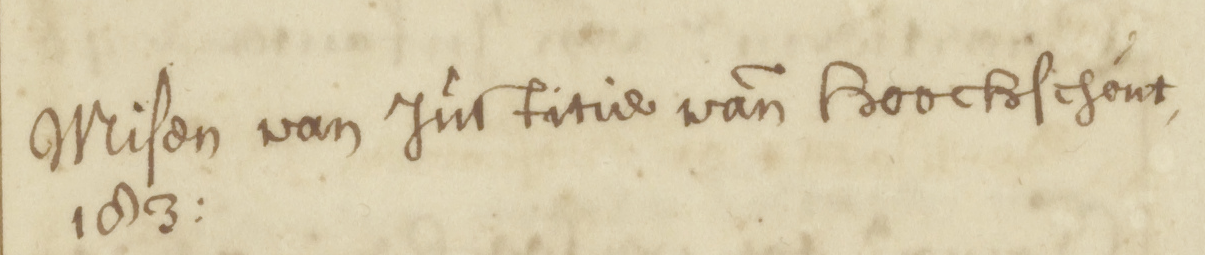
Misen van Justitie van Hoochschout
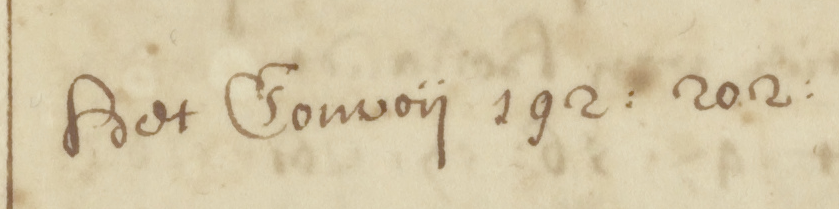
Het Convoij 192: 202:
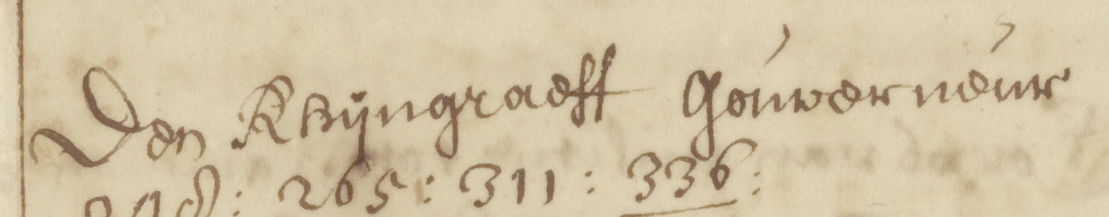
Den Rhijngraeff Gouverneur
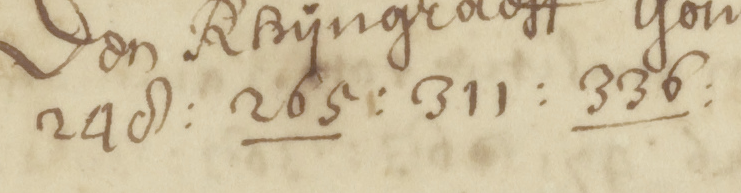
248: 265: 311: 336:
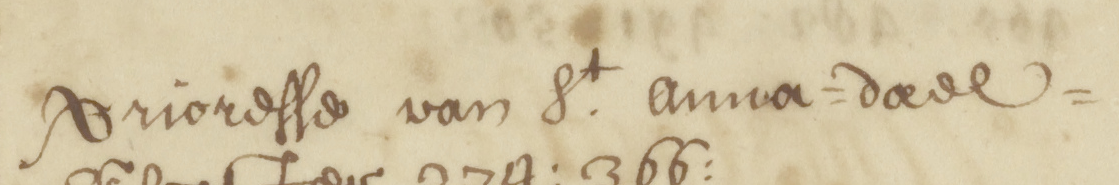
Prioresse van St. Anna=dael=
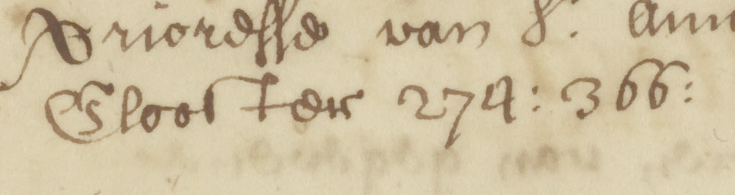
Clooster 274: 366:
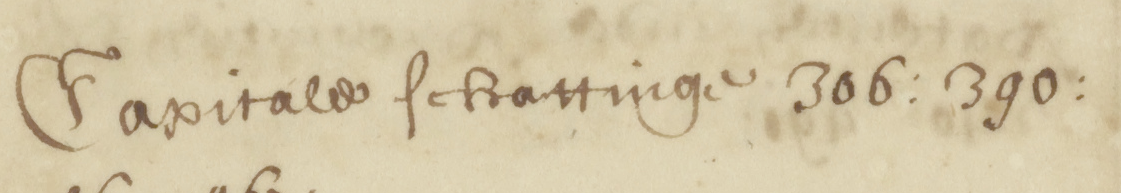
Capitale schattinge 306: 390:
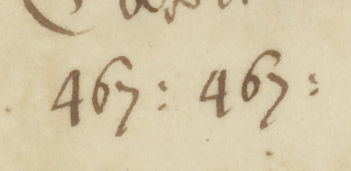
467: 467:
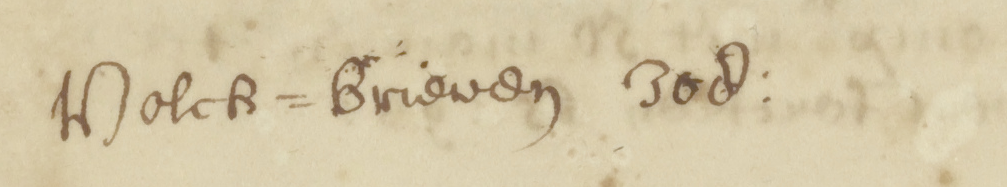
Volch=brieven 308:
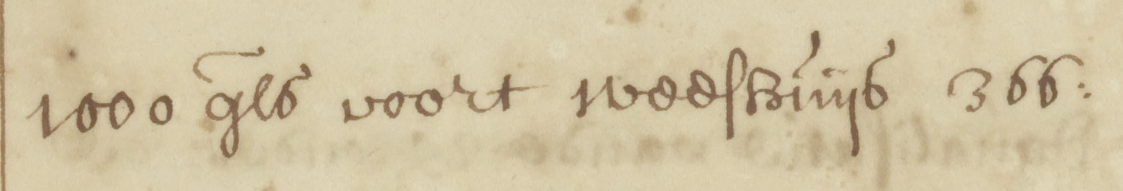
1000 gls voort weeshuijs 366:
